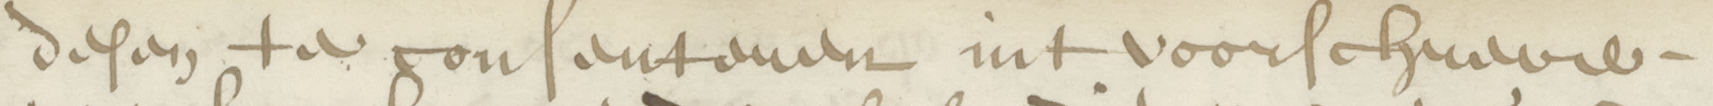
desen te consenteren int voorschreve
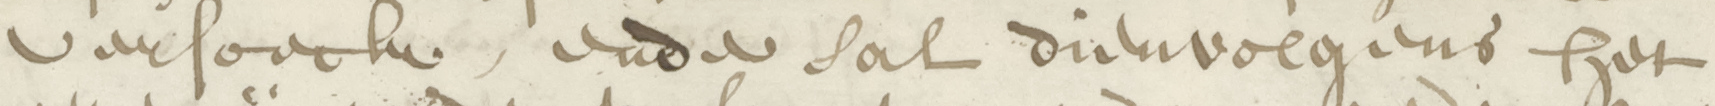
versoeck, ende sal dienvolgens het
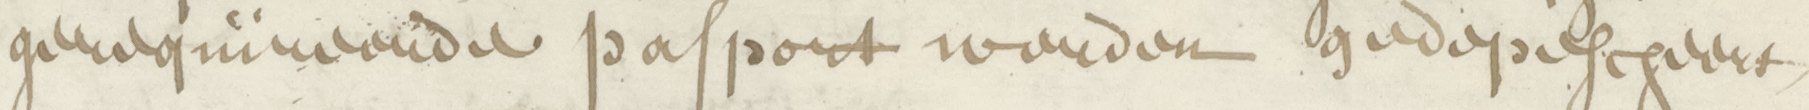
gerequireerde pasport werden gedepescheert.
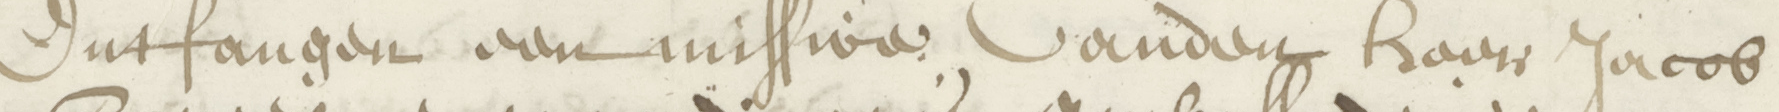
Ontfangen een missive vanden heer Jacob
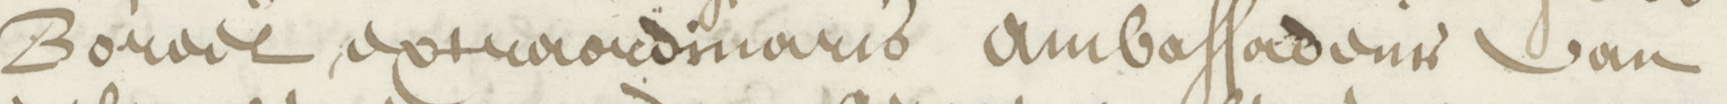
Boreel, extraordinaris Ambassadeur van
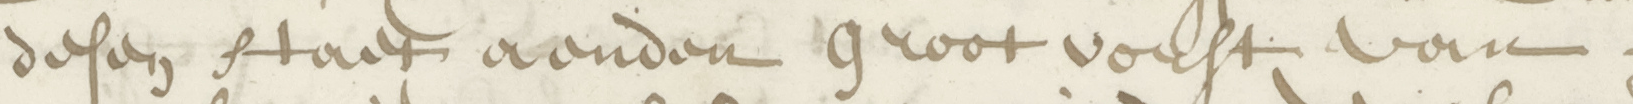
desen Staet aenden Groot vorst van
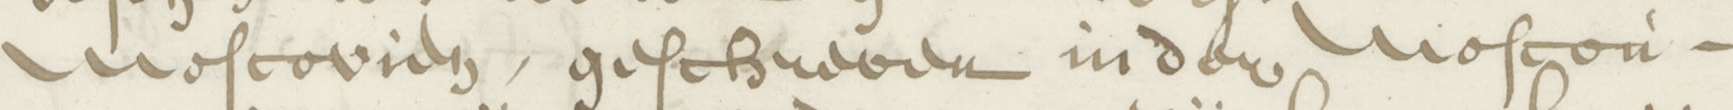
Moscovien, geschreven in der Moscou -
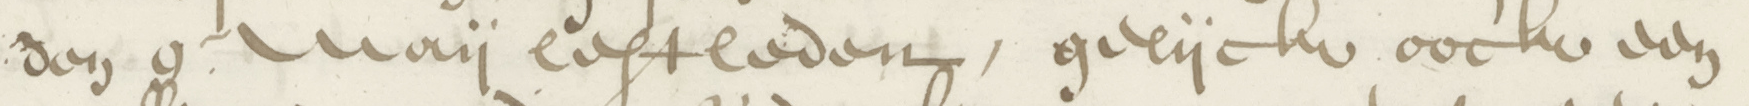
den 9e. Maij lestleden, gelijck oock een
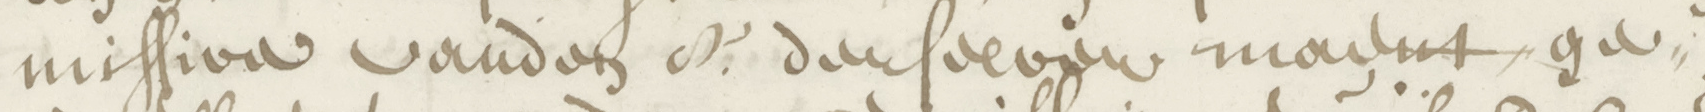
missive vanden 8e. derselver maent, ge,,
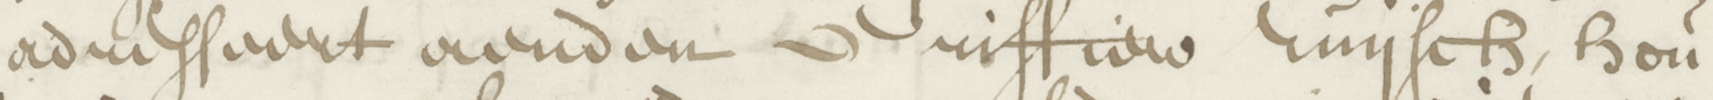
„adresseert aenden Griffien Ruijsch, hou
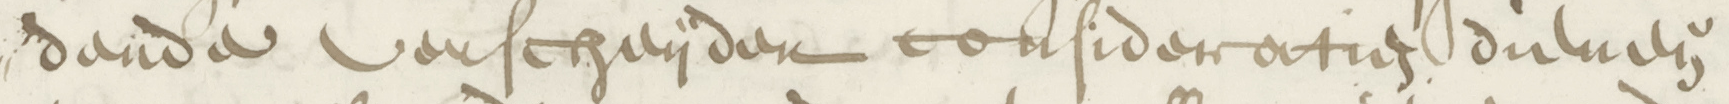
„dende verscheijden consideratien dienen
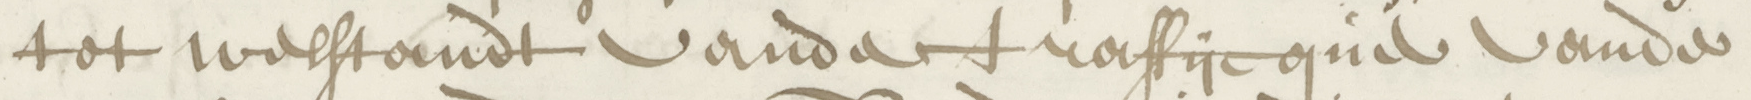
tot welstandt vande traffijcque vande
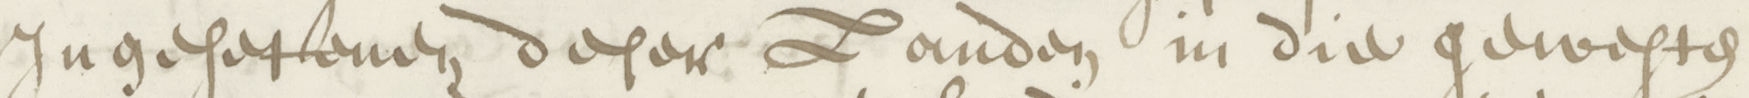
Ingesetenen deser Landen in die gewesten
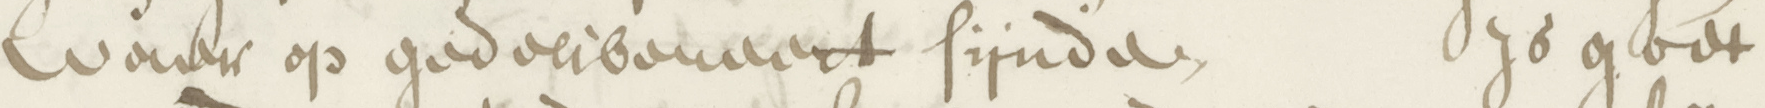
waer op gedelibereert sijnde, Is goet
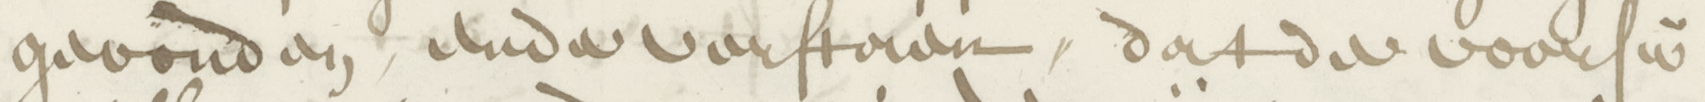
gevonden, ende verstaen, dat de voors
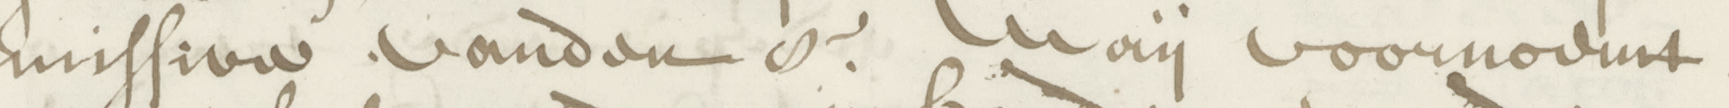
missive vanden 8e. Maij voornoemt
